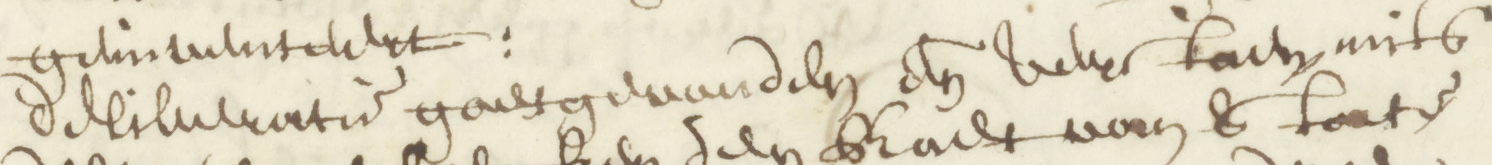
deliberatie goetgevonden en verstaen, mits
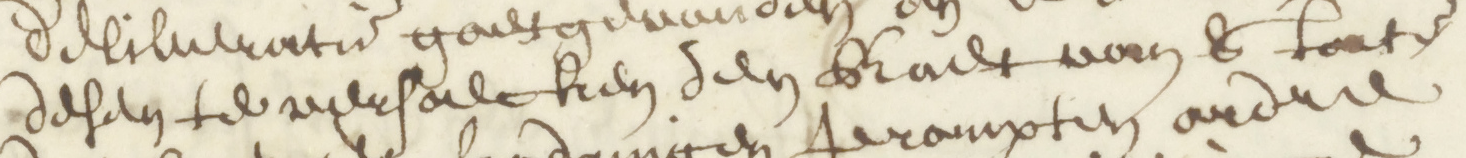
desen te versoecken den Raet van State
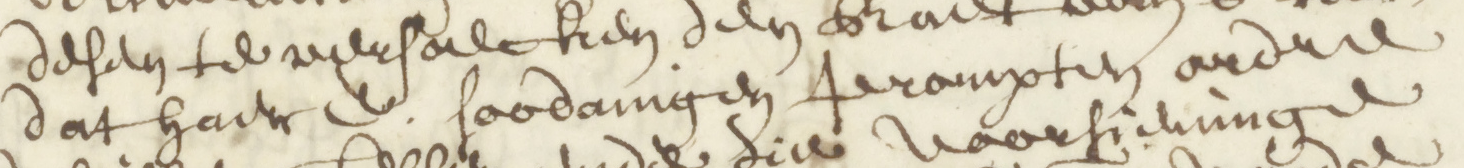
dat haer E. soodanigen prompten ordre
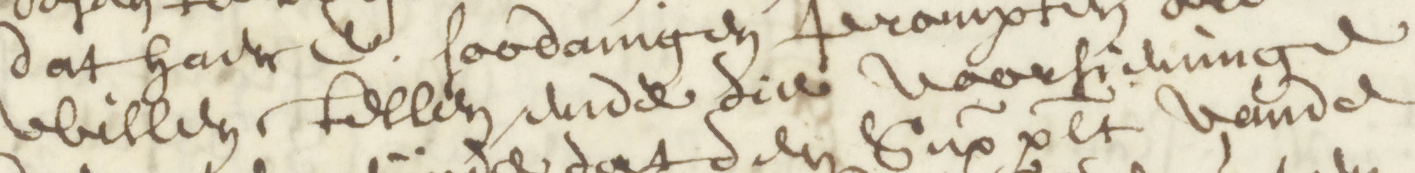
willen stellen, ende die voorsieninge
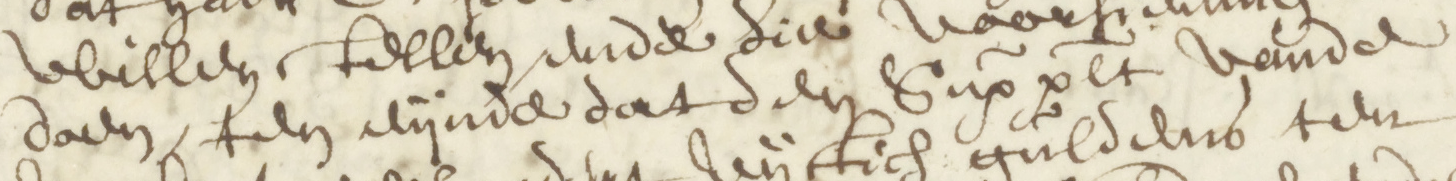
doen, ten eijnde dat den Supplt vande
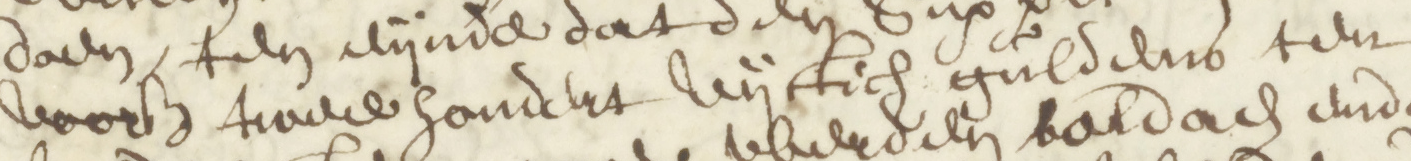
voorsz twee hondert vijftich guldens ten
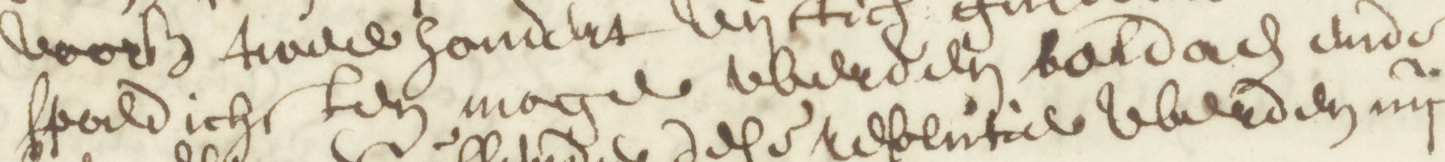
spoedichsten moge werden voldaen ende
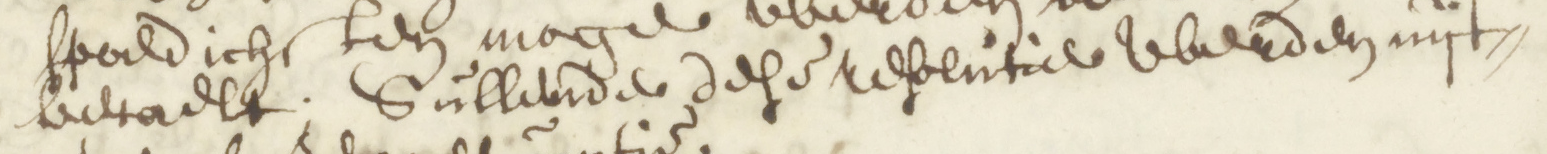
betaelt; Sullende dese resolutie werden uijt„
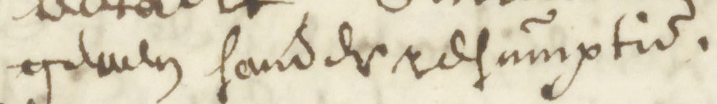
geven sonder resumptie.
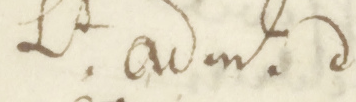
Lt. Adml. de
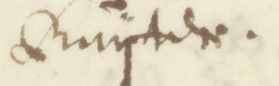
Ruijter.
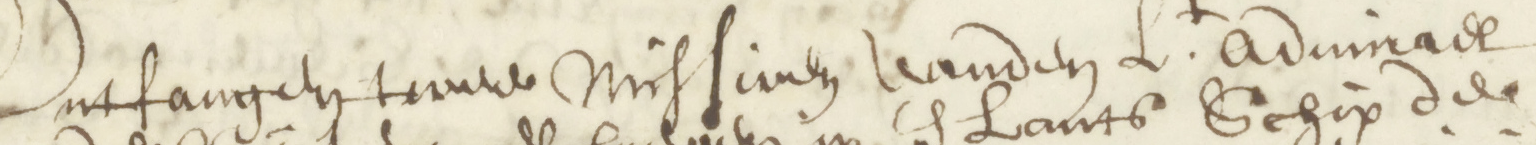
Ontfangen twee Missiven vanden Lt. Admirael
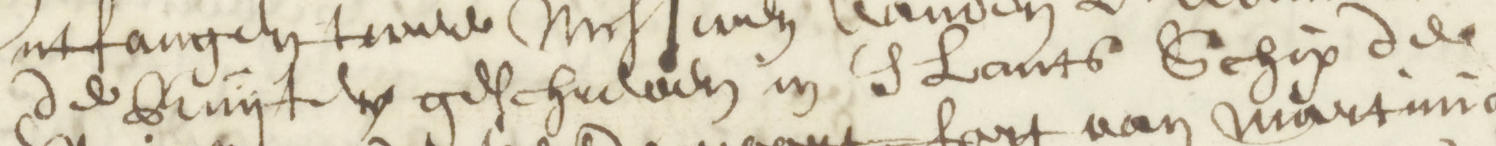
de Ruijter, geschreven in ‛sLants Schip de
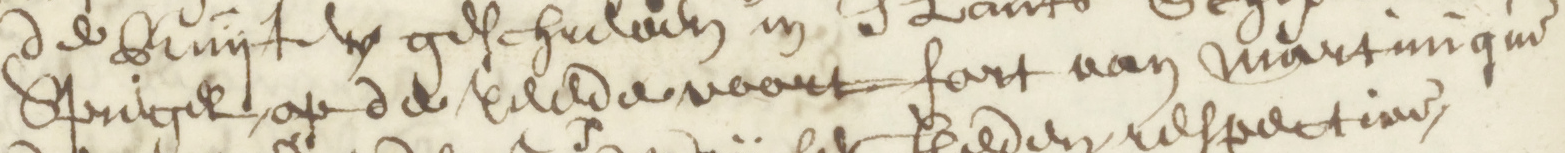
Spiegel, op de Reede voort fort van Martinique
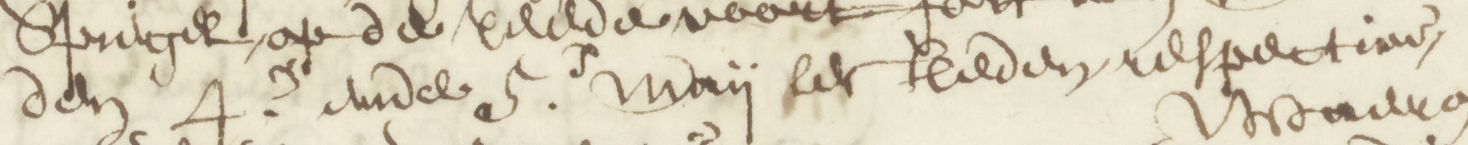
den 4.en ende 5. Maij lestleden, respective,
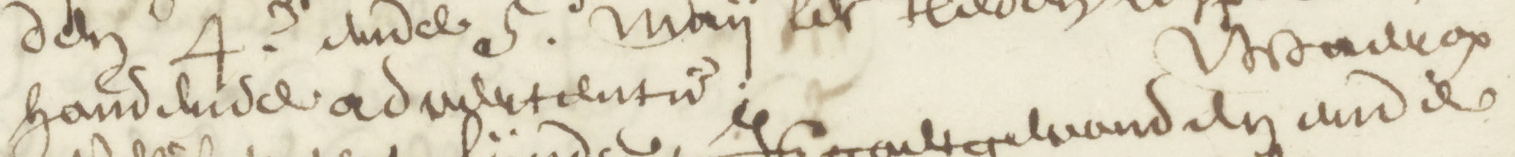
houdende advertentie. Waerop
